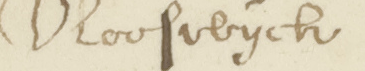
Vlooswijck
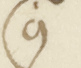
Ca
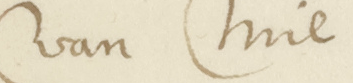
van Mil
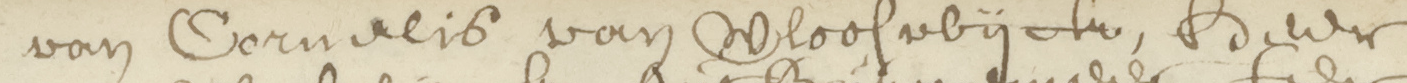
van Cornelis van Vlooswijck, Heer
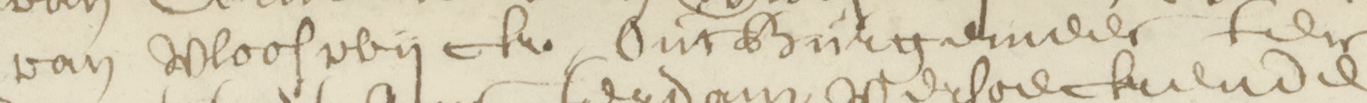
van Vlooswijck, Out Burgemeester
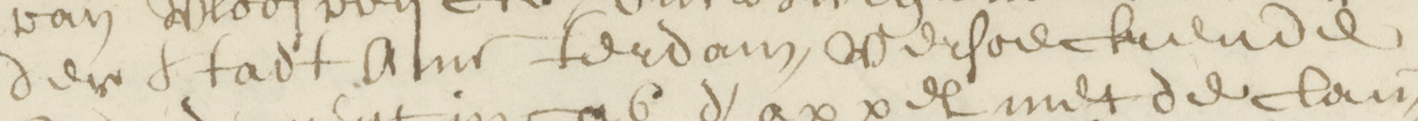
der Stadt Amsterdam, versoeckende
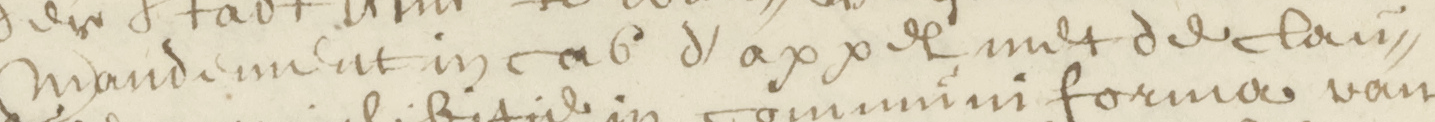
Mandemant in cas d'appel met de clau,,
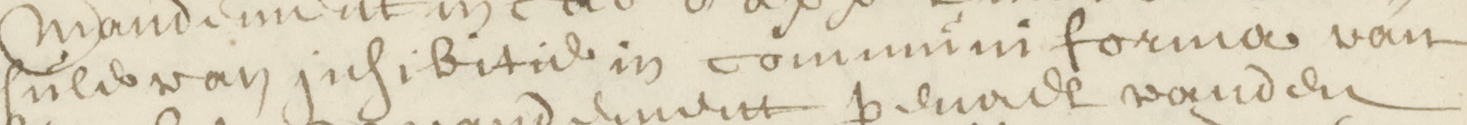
sule van Inhibitie in communi forma van
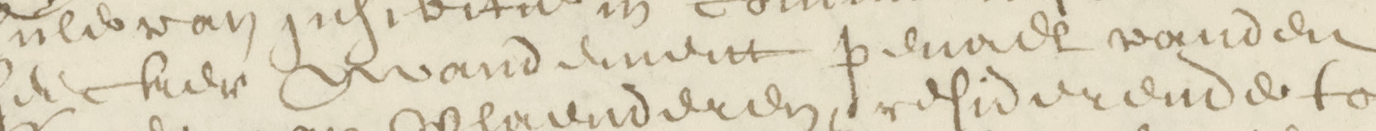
seecker Mandement penael vanden
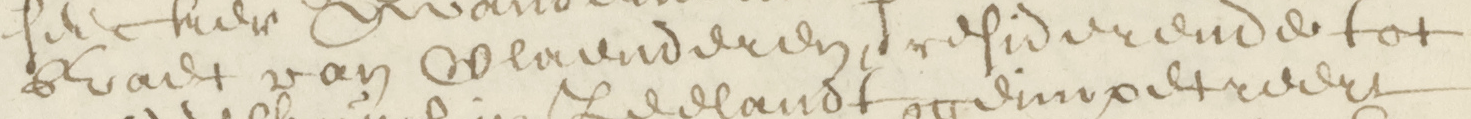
Raet van Vlaenderen, residerende tot
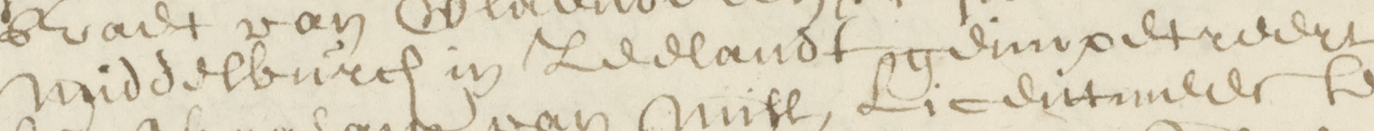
Middelburch in Zeelandt geimpetreert
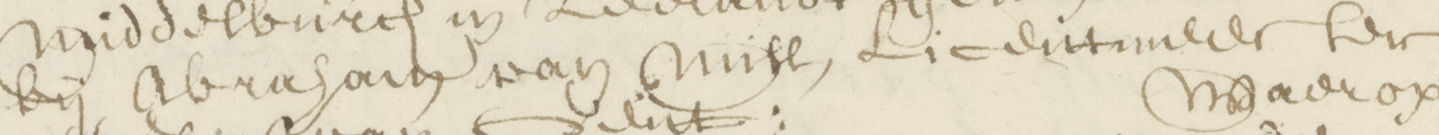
bij Abraham van Mill, Licentmeester
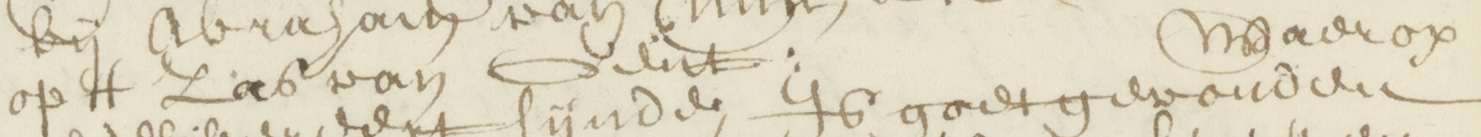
op 't Zas van Gent: Waerop
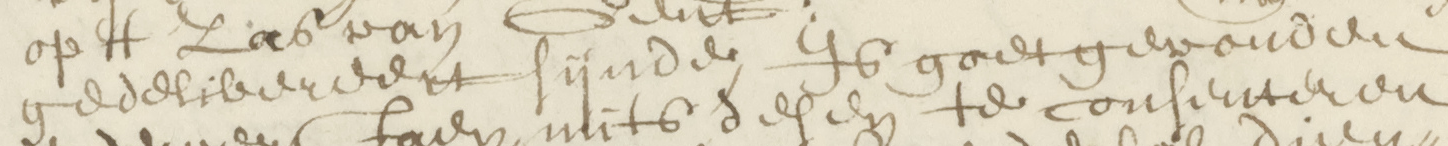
gedelibereert sijnde; Is goetgevonden
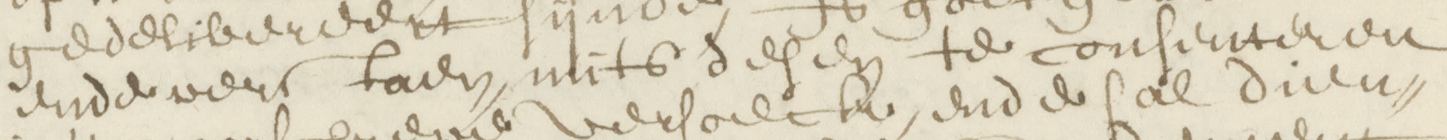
ende verstaen, mits desen te consenteren
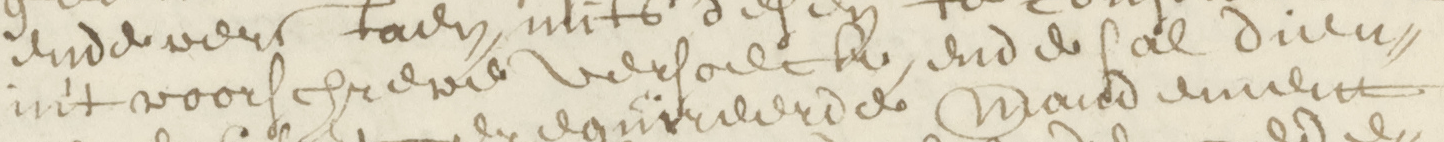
in't voorschreve versoeck, ende sal dien,,
